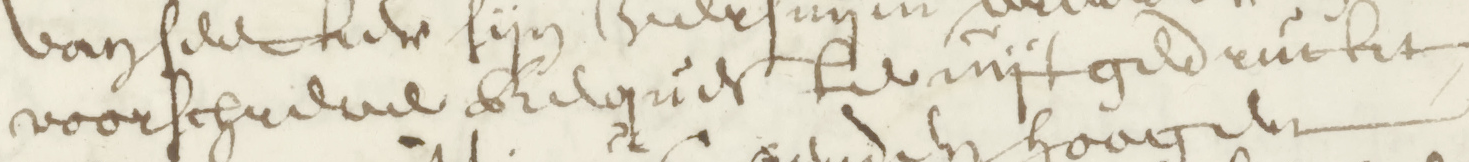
voorschreve Requeste uijtgedruckt,
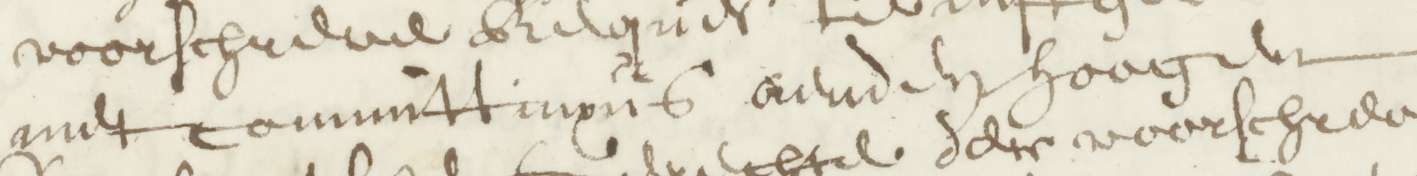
met committimus aenden hoogen
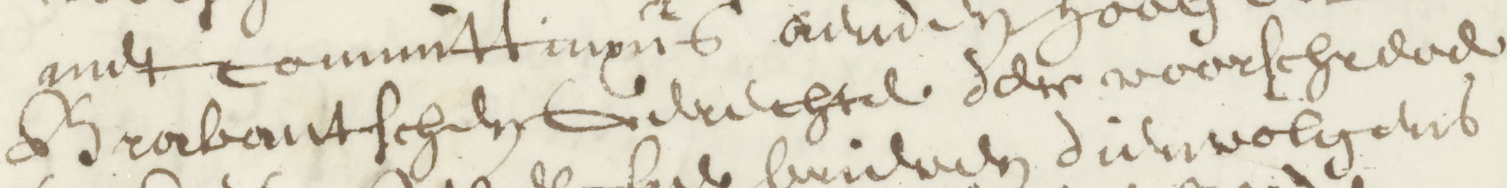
Brabantschen Gerechte der voorschreve
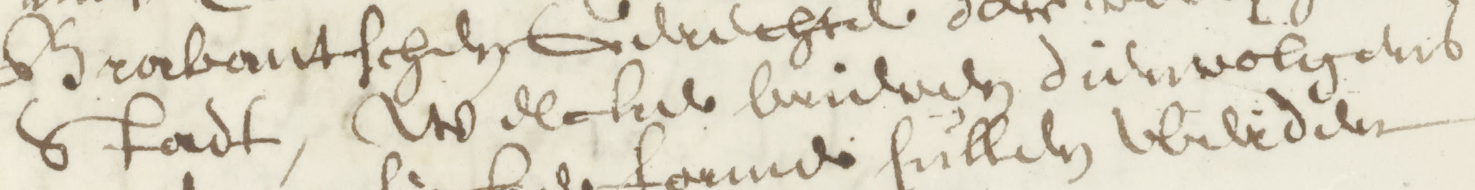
Stadt, Welcke brieven dienvolgens
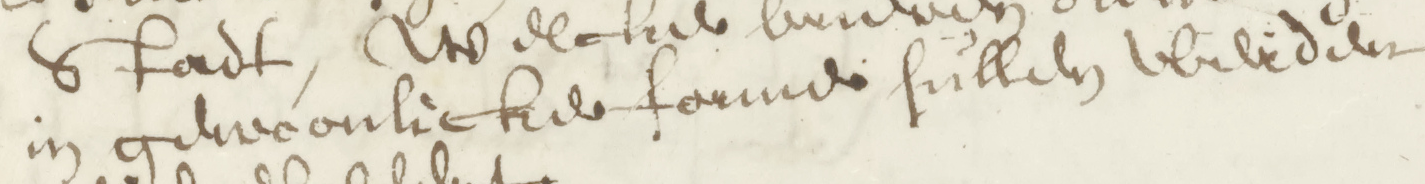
in gewoonlicke forme sullen werden
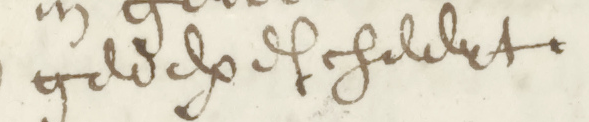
gedepescheert.
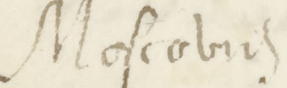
Moscovien
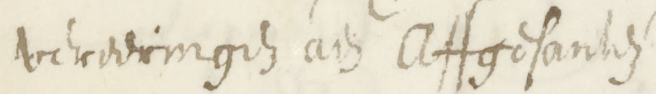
vereeringen aen Affgesanten
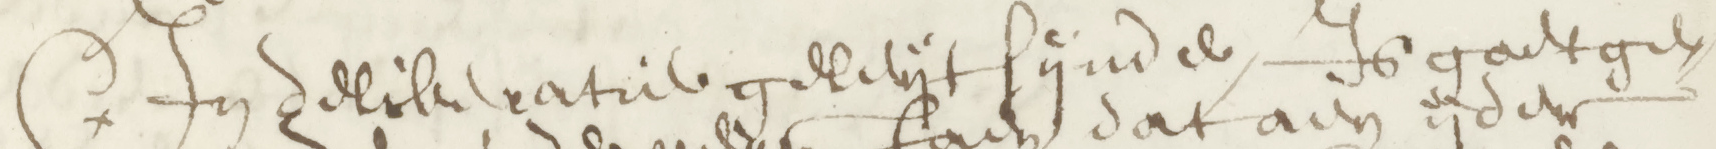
In deliberatie geleijt sijnde, Is goetge„
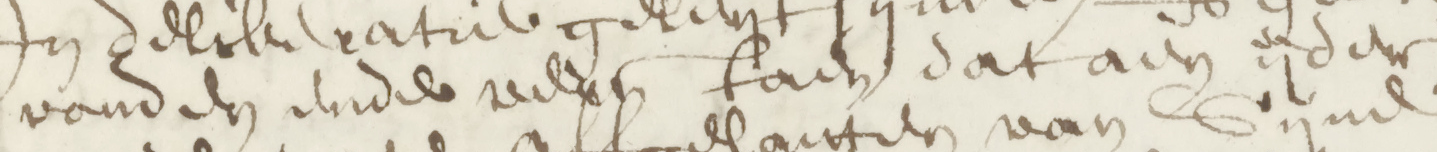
vonden ende verstaen, dat aen ijder
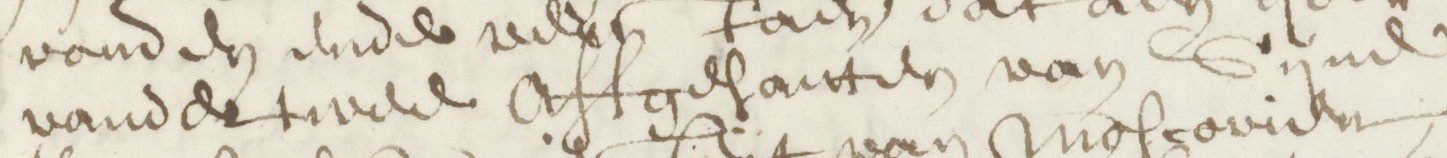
vande twee Affgesanten van Sijne
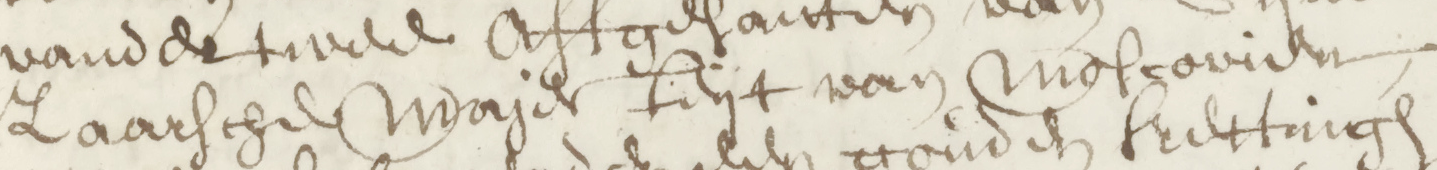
Zaarsche Majesteijt van Moscovien,
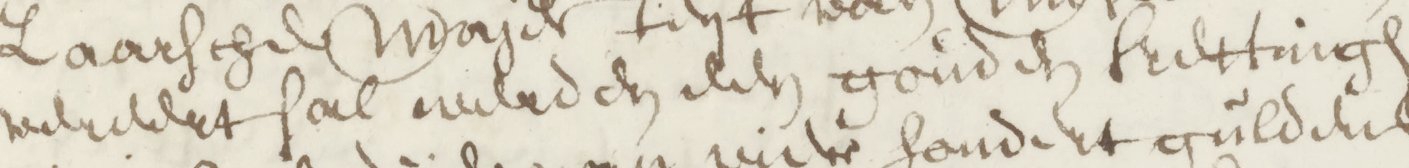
vereert sal werden een gouden Kettingh
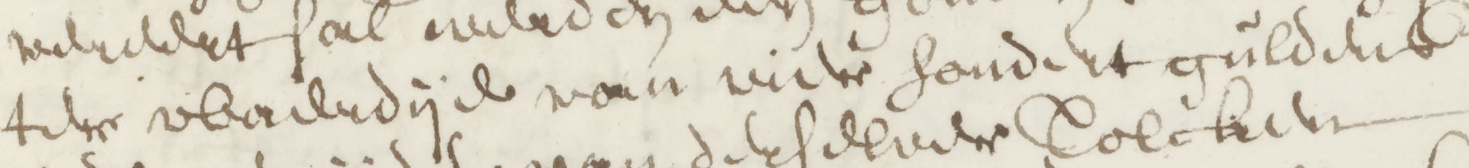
ter waerdije van vier hondert guldens
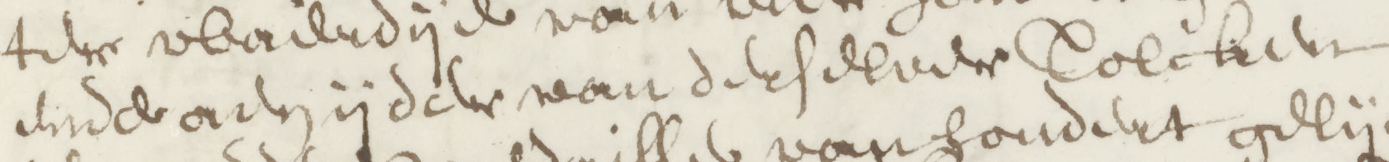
ende aen ijder van derselver Tolcken
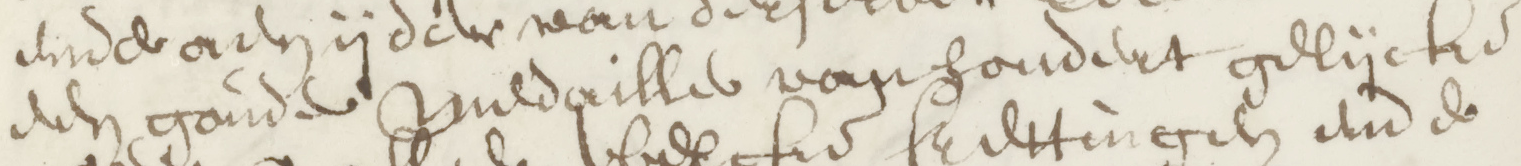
een goude Medaille van hondert gelijcke
